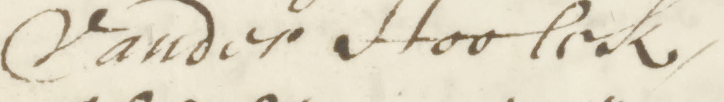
Vander Hoolck,
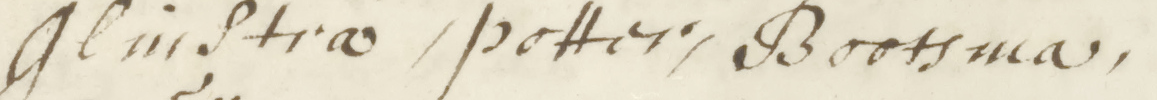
Glinstra, Potter, Bootsma,,
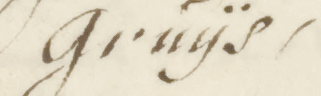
Gruijs.
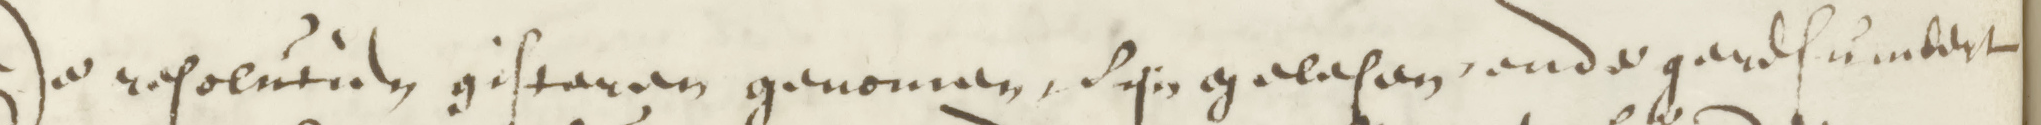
De resolutien gisteren genomen, sijn gelesen, ende geresumeert
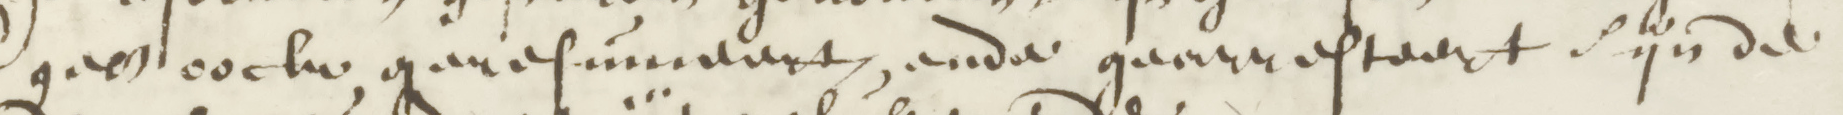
gel oock geresumeert, ende gearresteert sijn de
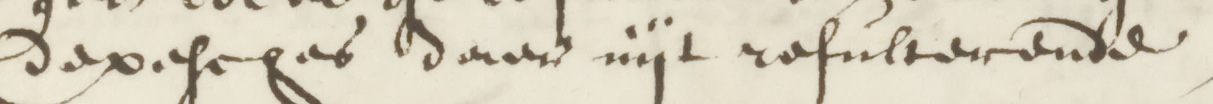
depesches daer uijt resulterende.
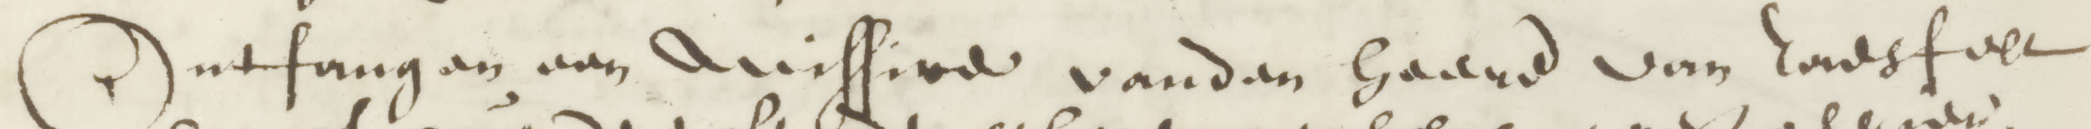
Ontfangen een missive vanden heere van Raesfelt
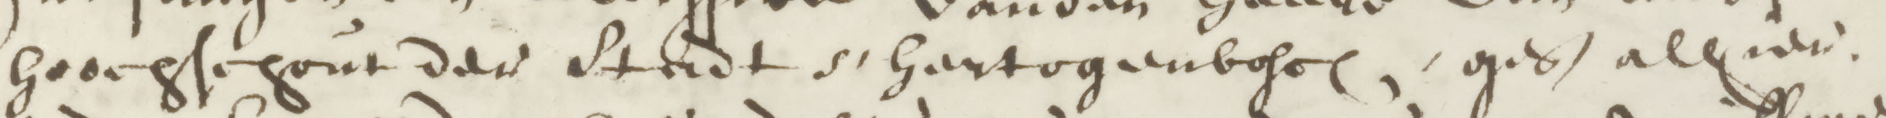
hoochschout der stadt s'hertogenbosch, ges alhier
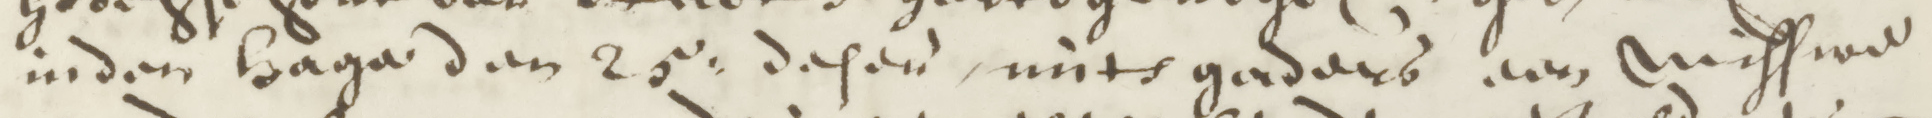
inden Hage den 25. desen, mitsgaders een missive
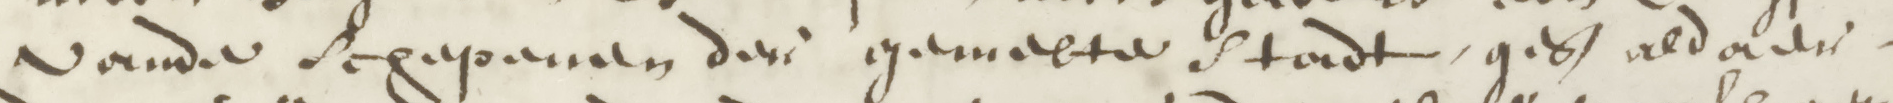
vande schepenen der gemelte stadt, ges aldaer
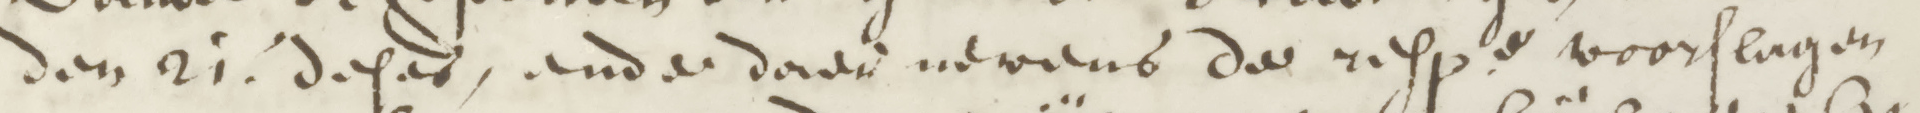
den 21e. deses, ende daer nevens de respe. voorslagen
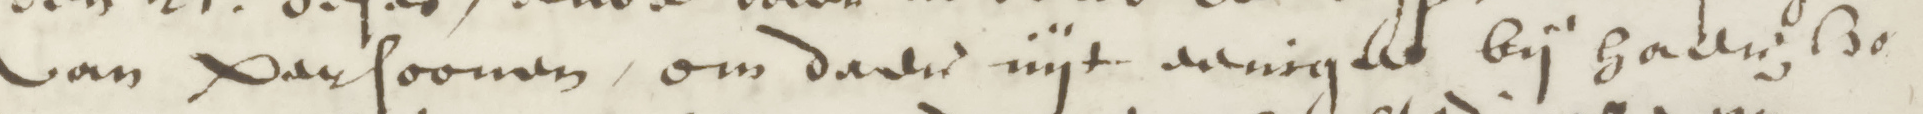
van persoonen, om daer uijt eenige bij haer Ho:
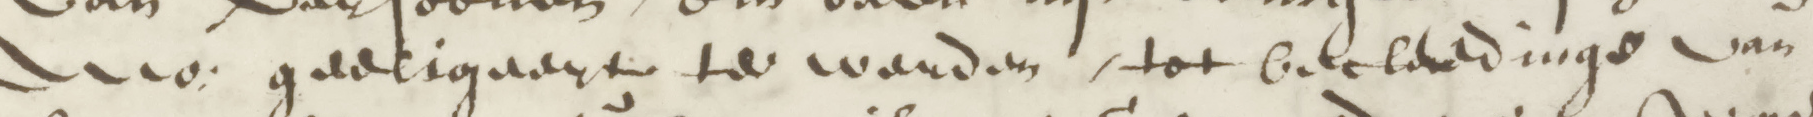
Mo: geeligeert te werden, tot becleedinge van
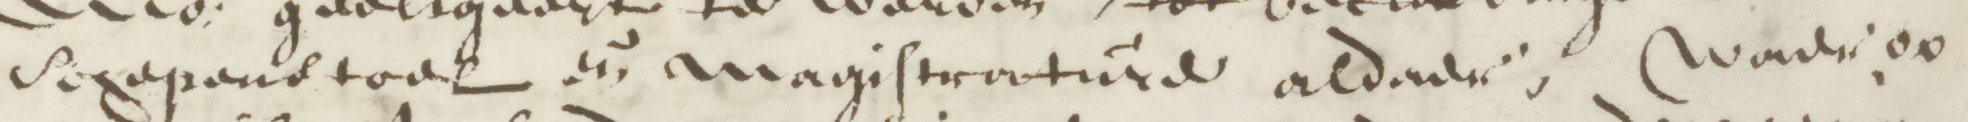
Schepenstoel en Magistrature aldaer; Waerop
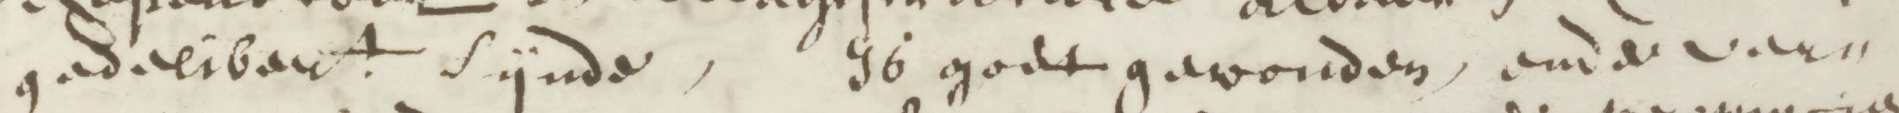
gedelibert. sijnde, Is goet gevonden, ende ver„
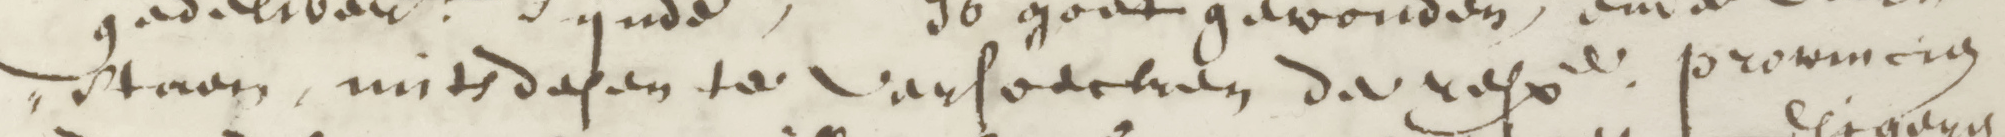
,,staen, mitsdesen te versoecken de respe. provincien
